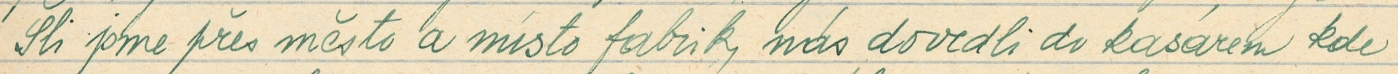Šli jsme přes město a místo fabriky nás dovedli do kasáren kde
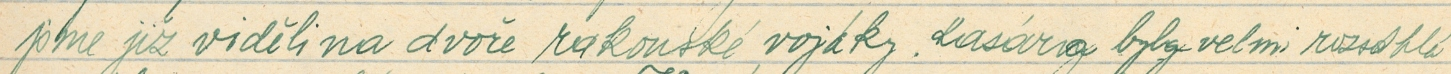jsme již viděli na dvoře rakouské vojáky. Kasárna byla velmi rozsáhlá
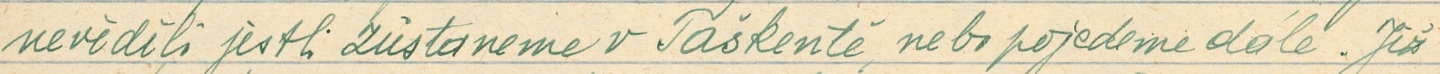nevěděli jestli zůstaneme v Taškentě, nebo pojedeme dále. Již
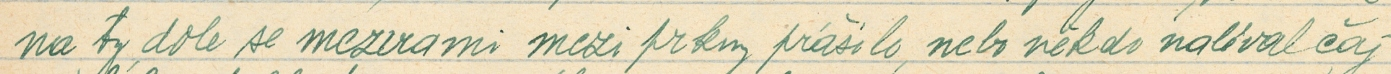na ty dole se mezerami mezi prkny prášilo, nebo někdo naléval čaj
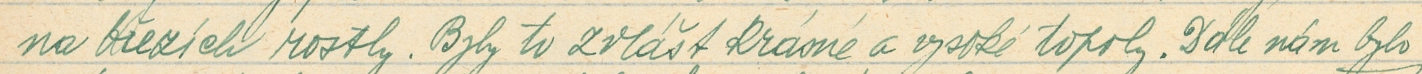na březích rostly. Byly to zvlášt krásné a vysoké topoly. Dále nám bylo
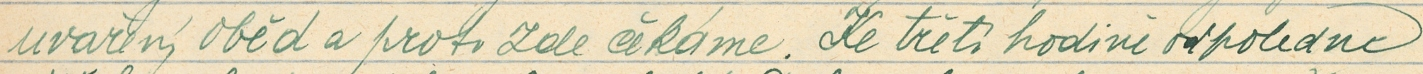uvařený oběd a proto zde čekáme. Ke třetí hodině odpoledne
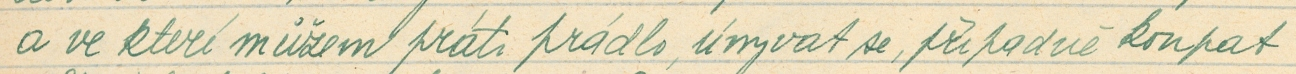a ve které můžem práti prádlo, umývat se, případně koupat
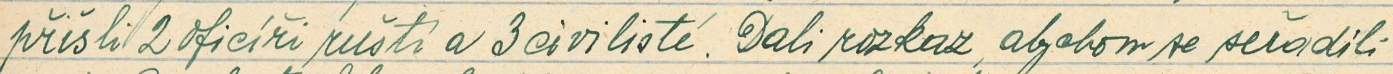přišli 2 oficíři ruští a 3 civilisté. Dali rozkaz, abychom se seřadili
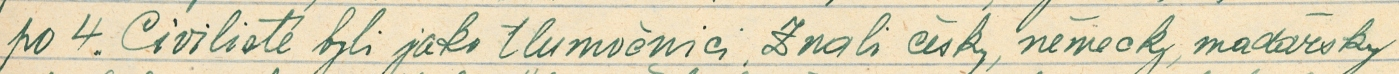po 4. Civilisté byli jako tlumočnici. Znali česky, německy, maďarsky
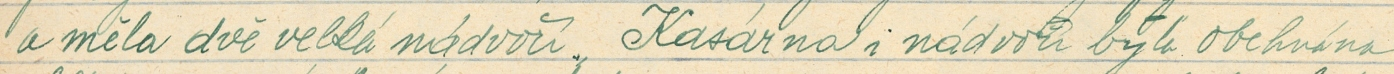a měla dvě velká nádvoří. Kasárna i nádvoří byla obehnána
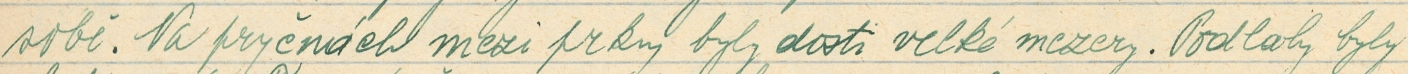sobě. Na pryčnách mezi prkny byly dosti velké mezery. Podlahy byly
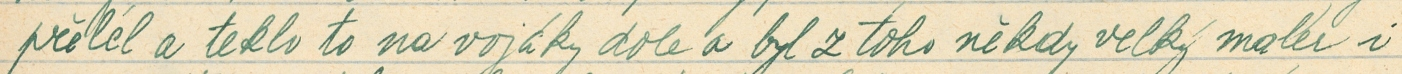přelél a teklo to na vojáky dole a byl z toho někdy velký malér i
